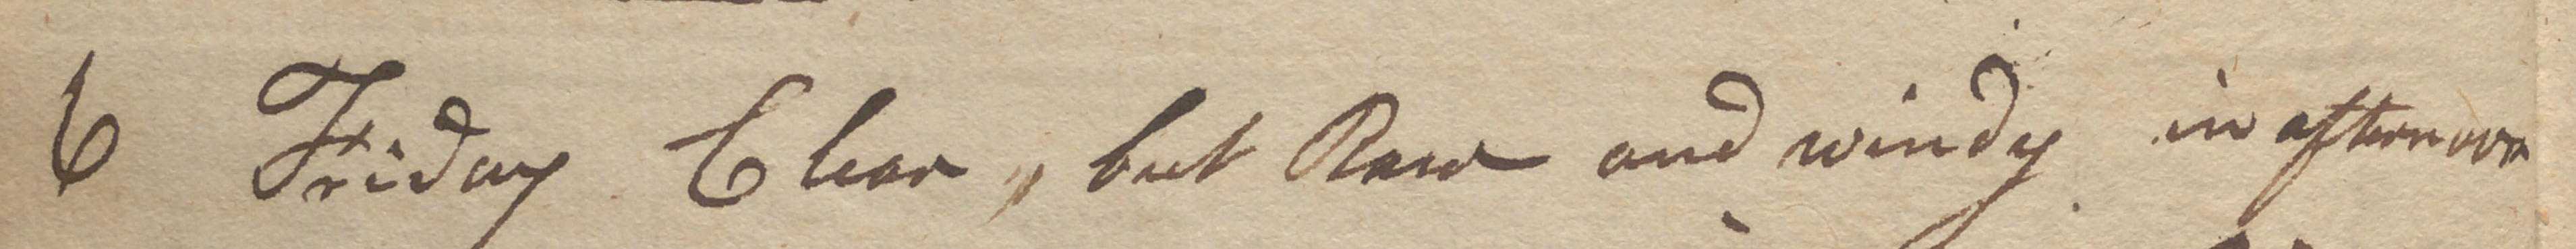6 Friday Clear, but Raw and windy in afternoon
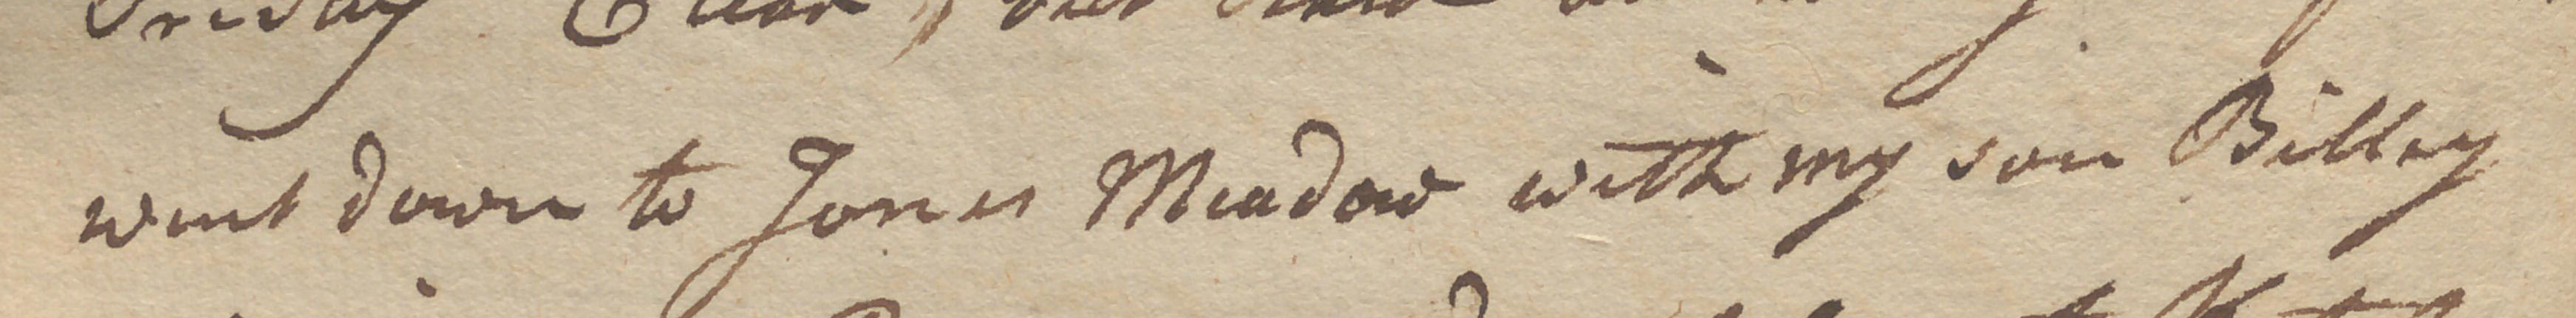went down to Jones Meadow with my son Billey
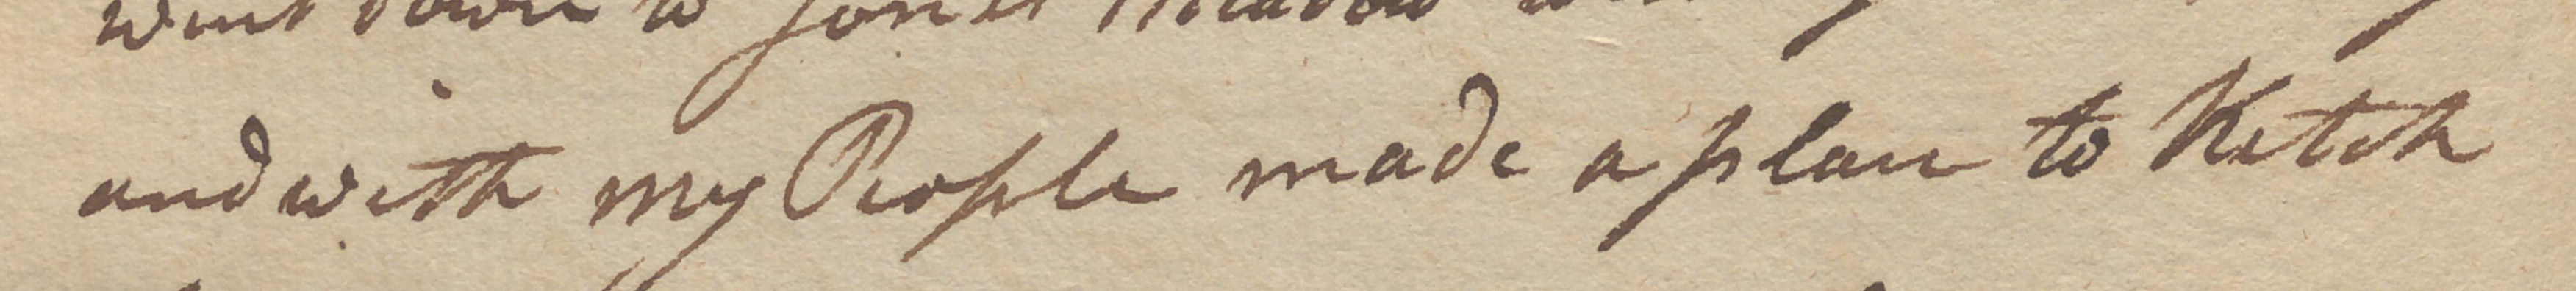and with my People made a plan to Kitch
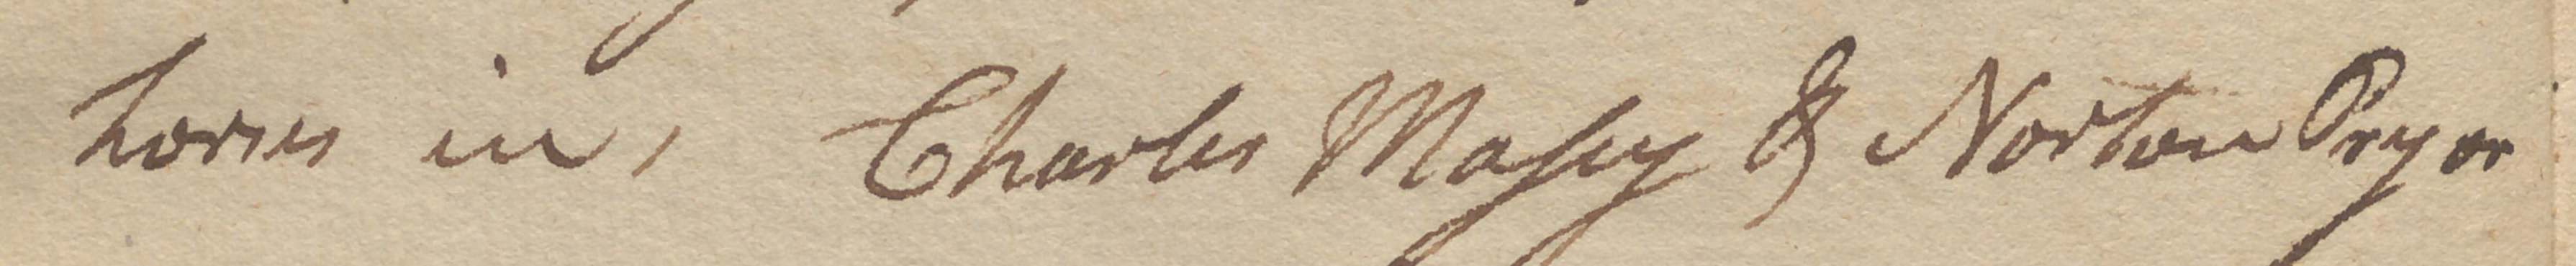horses in, Charles Masey & Norton Pryor
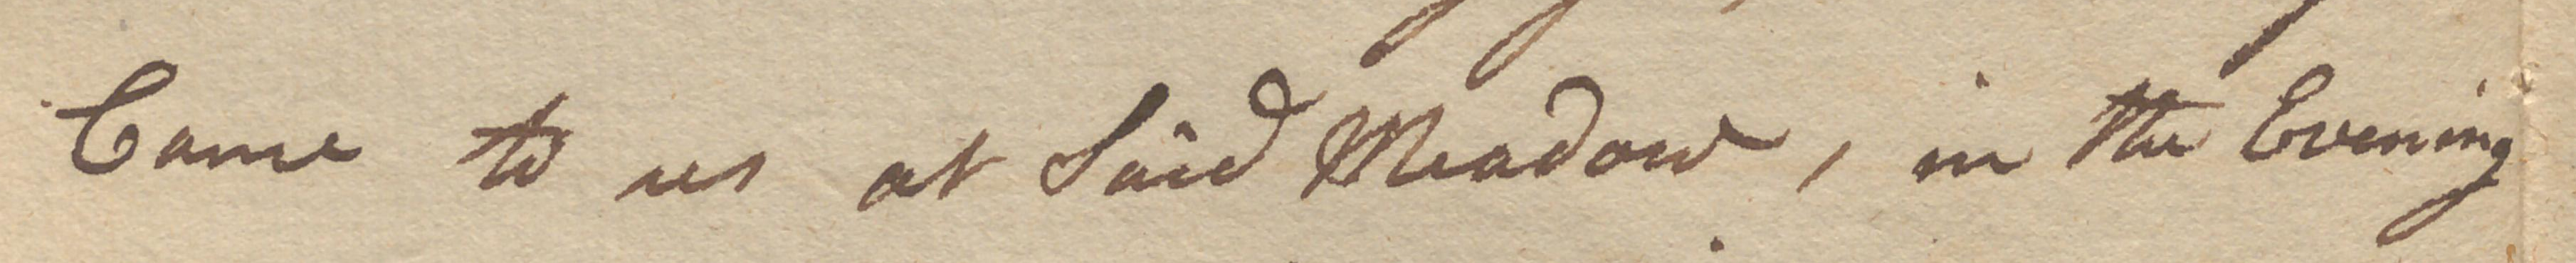Came to us at Said Meadow, in the Evening
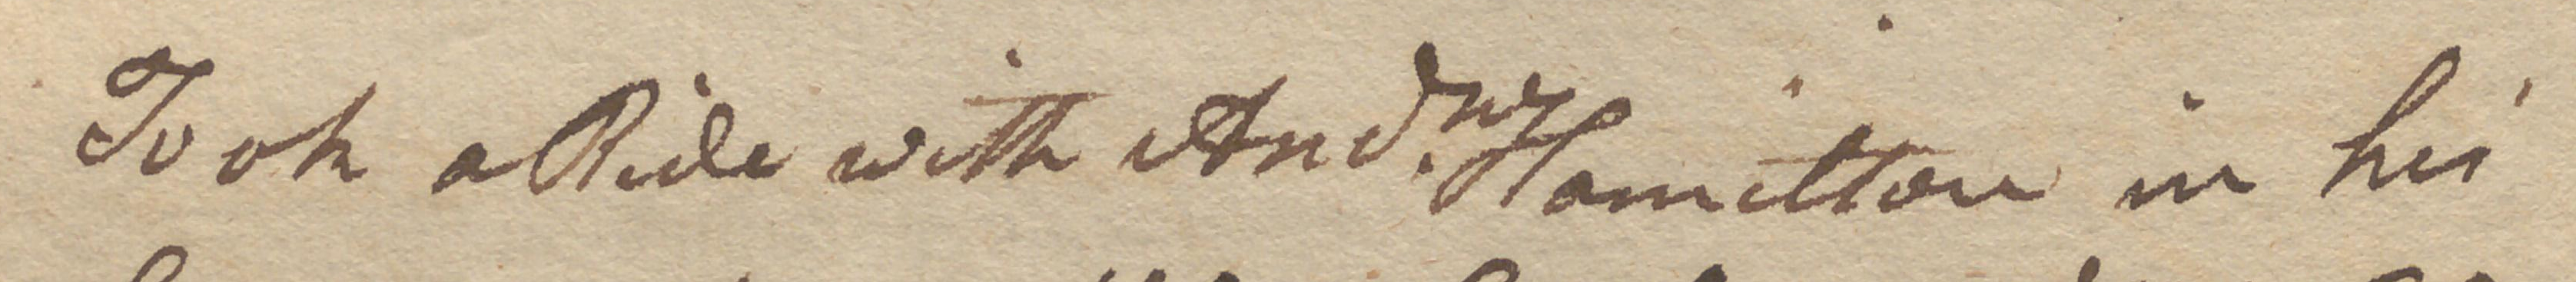Took a Ride with And^w. Hamilton in his
